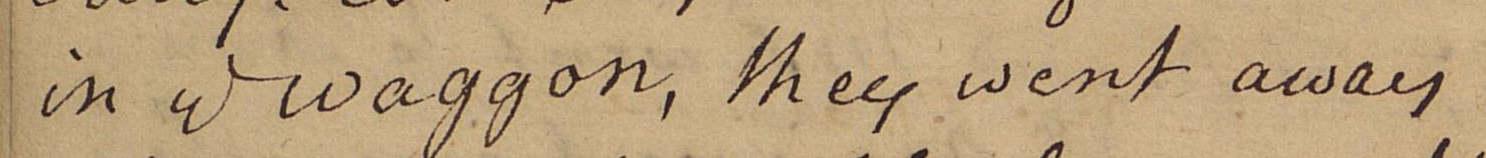in y^e waggon, they went away
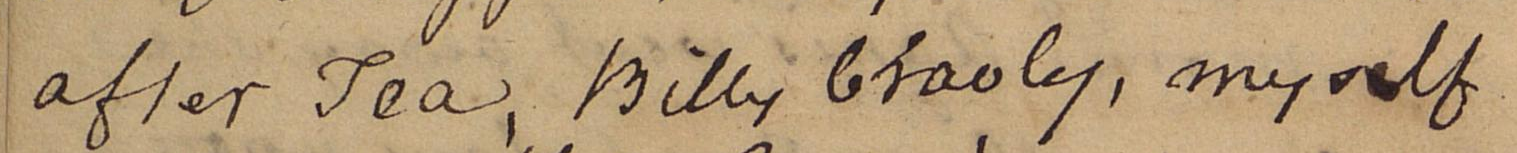after Tea, Billy bravly, myself
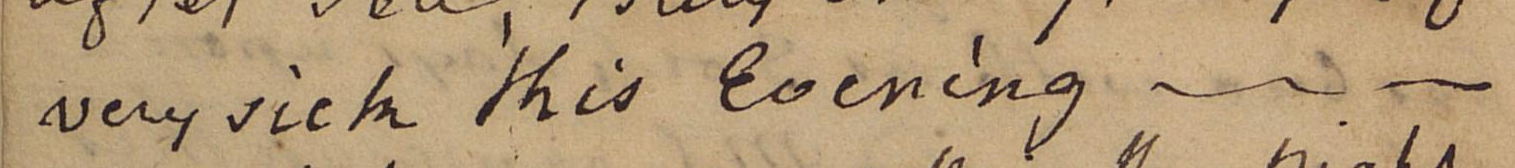very sick this Evening-
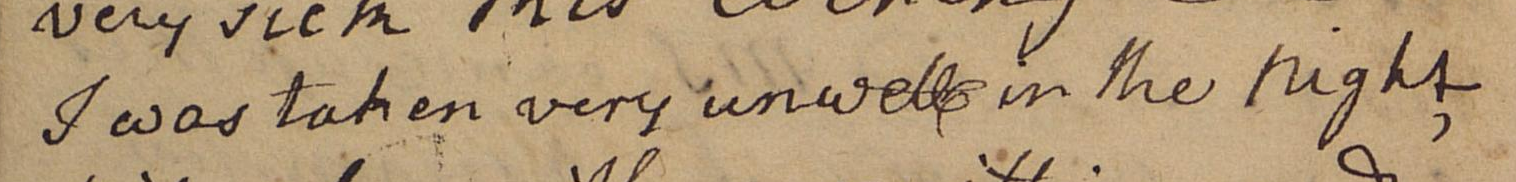I was taken very unwell in the night
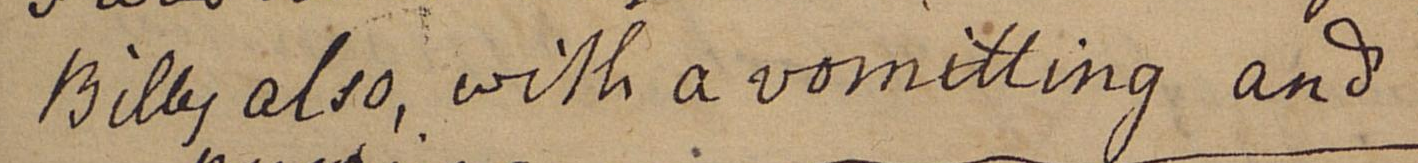Billy also, with a vomitting and
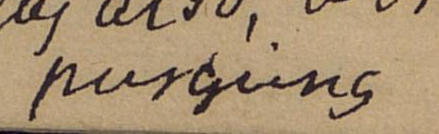purging
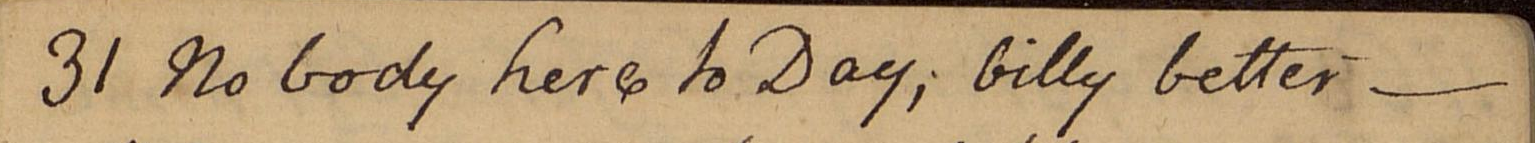31 No body here to Day; billy better-
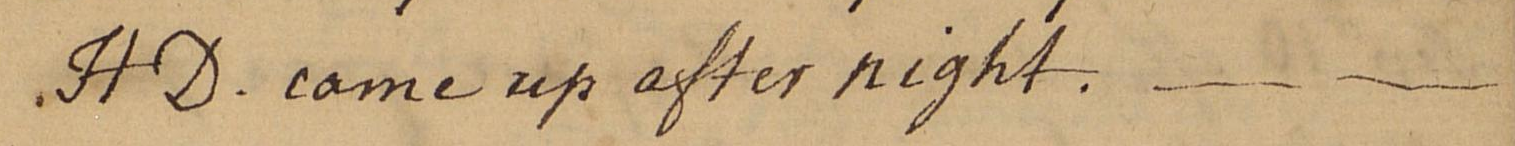HD. came up after night.-
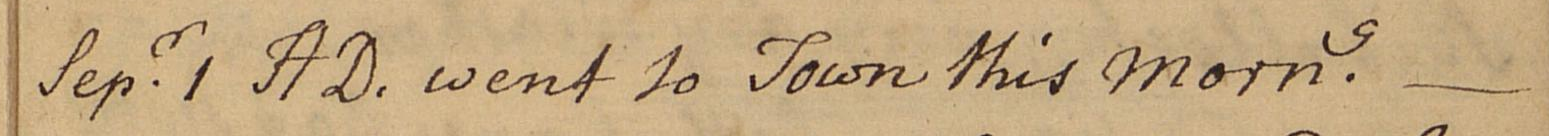Sep^r 1 HD. went to Town this Morn^g.-
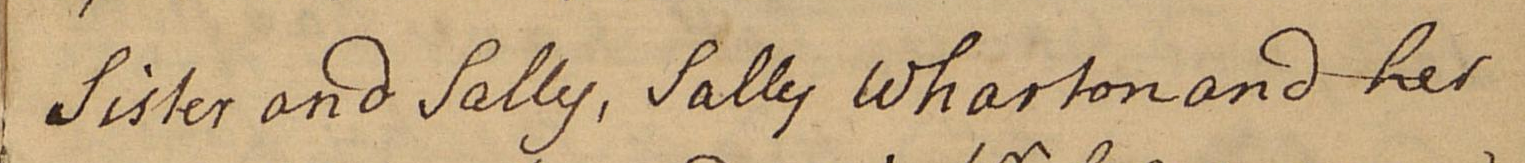Sister and Sally, Sally Wharton and her
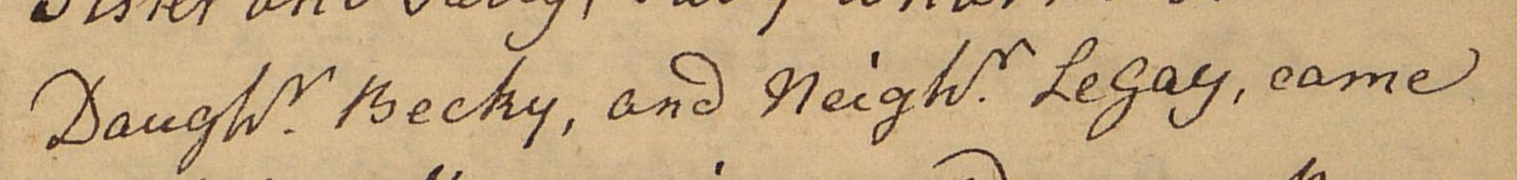Daugh^r. Becky, and Neigh^r. Legay, came
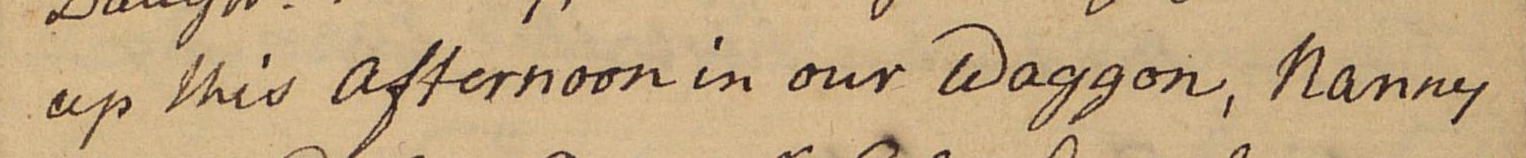up this Afternoon in our Waggon, Nanny
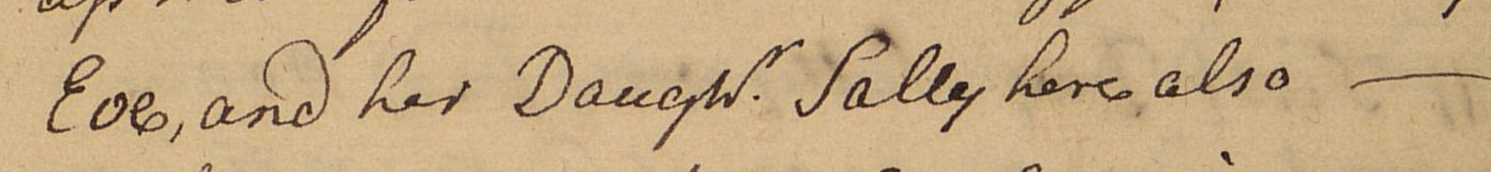Eve, and her Daugh^r. Sally here also-
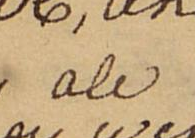all
